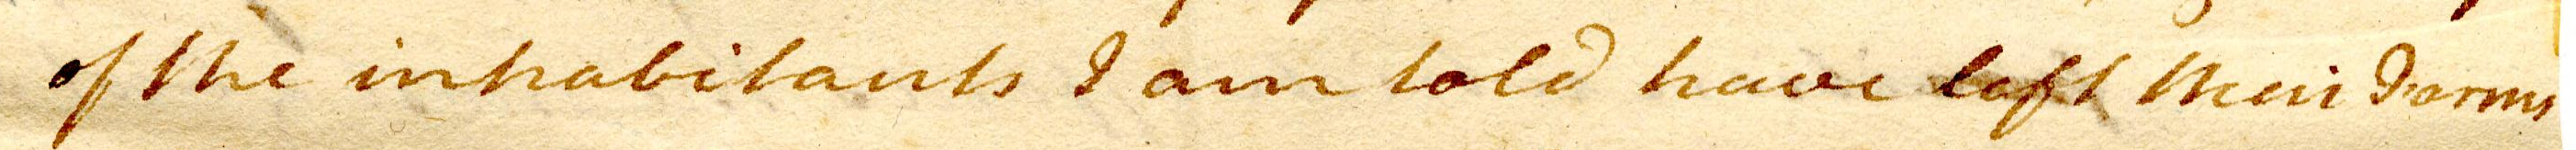of the inhabitants I am told have left their farms
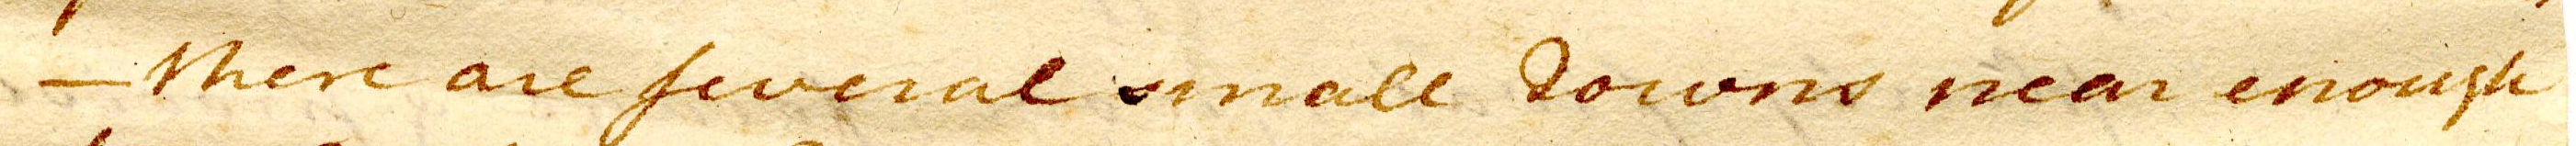- there are several small Towns near enough
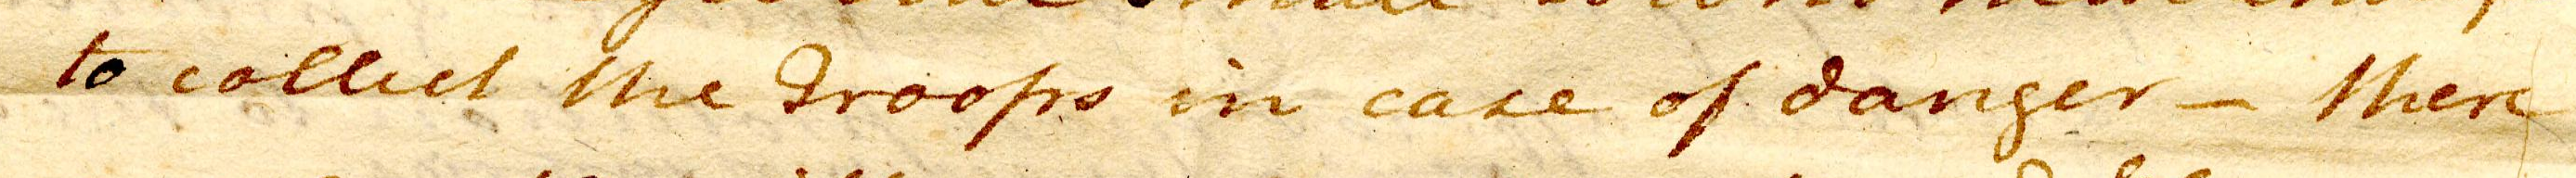to collect the Troops in case of danger- there
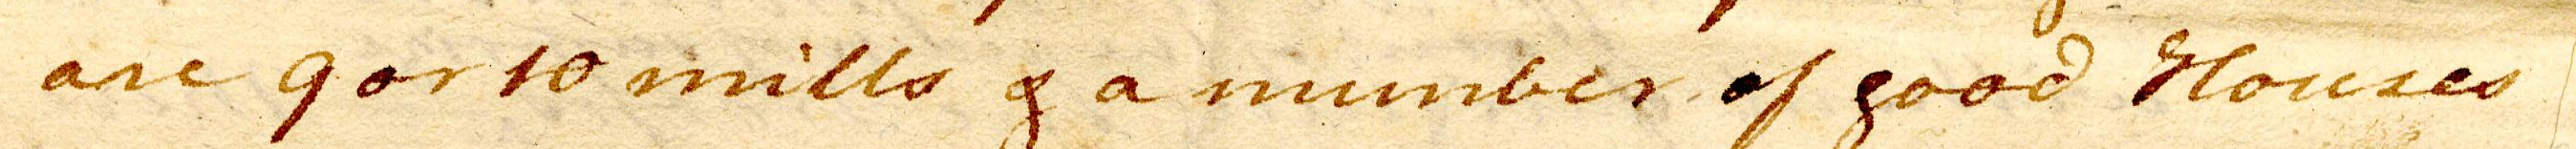are 9 or 10 mills & a number of good Houses
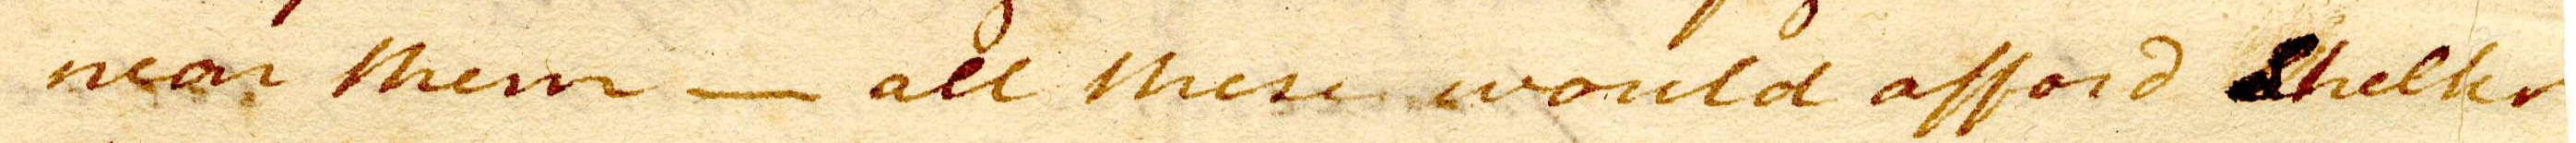near them- all these would afford shelter
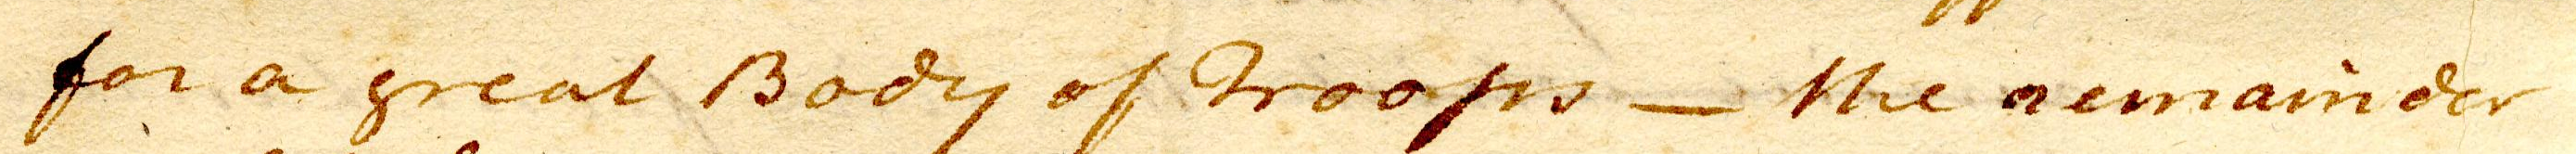for a great Body of Troops- the remainder
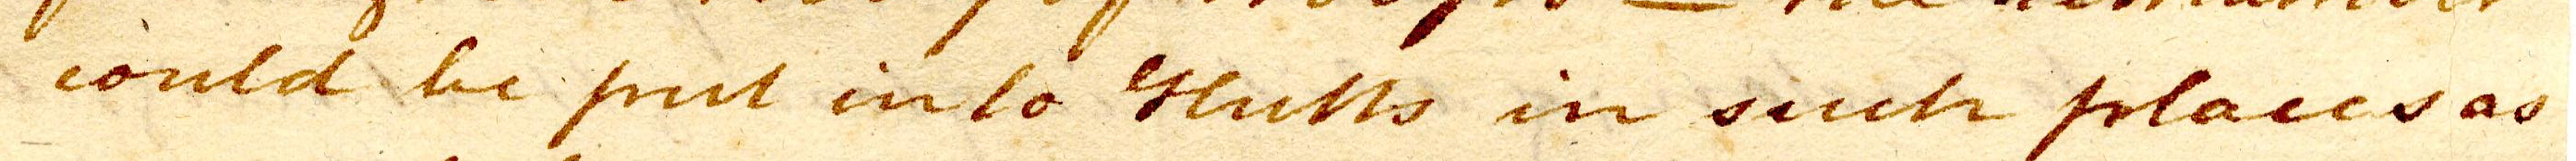could be put into Hutts in such places as
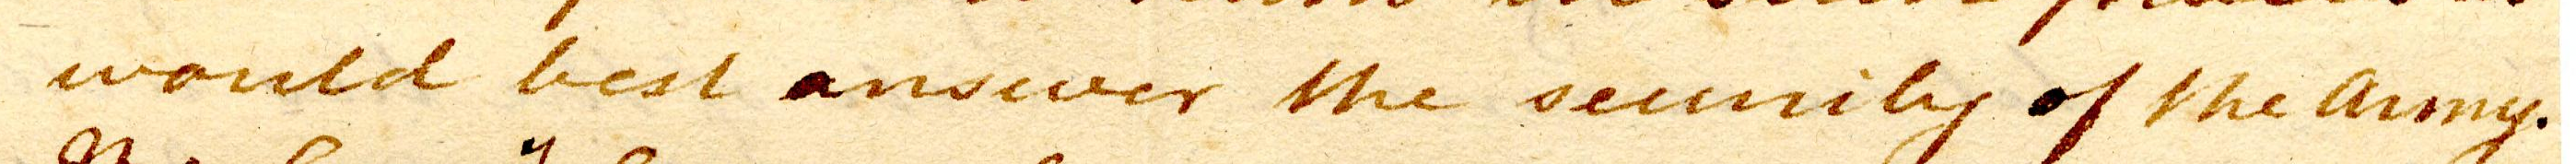would best answeer the security of the Army.
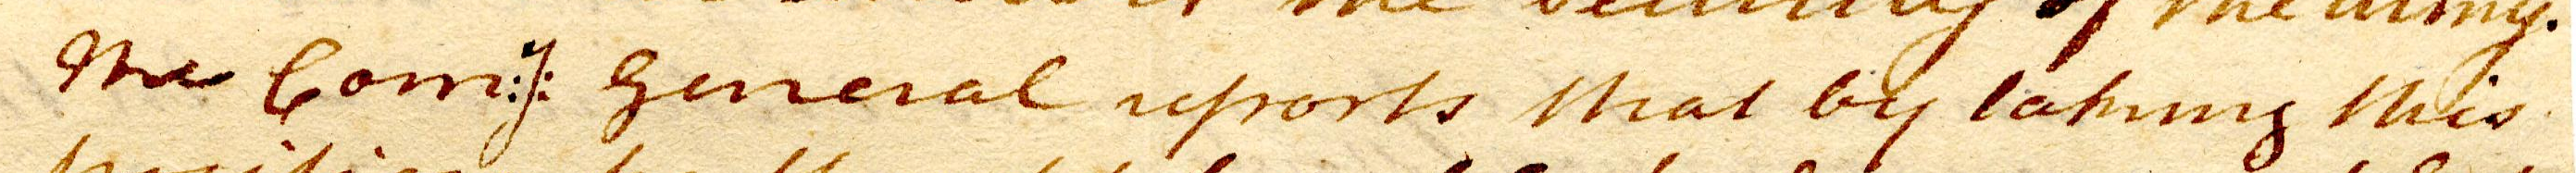The Com^y: General reports that by taking this
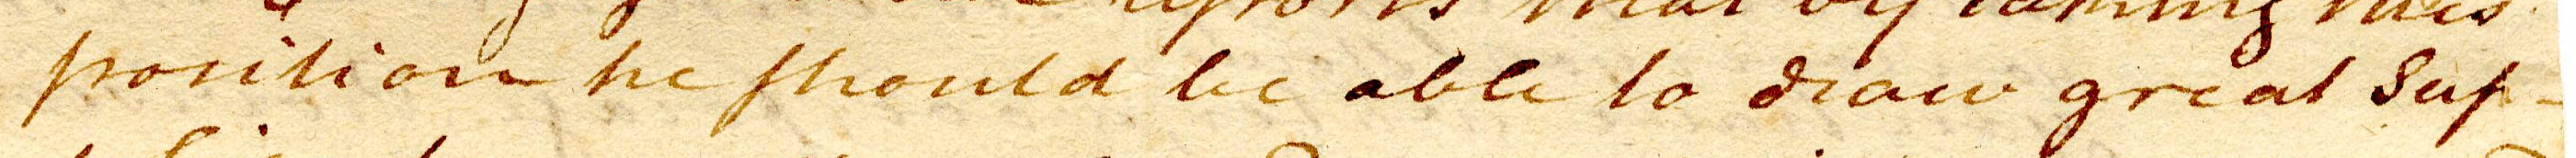position he should be able to draw great Sup-
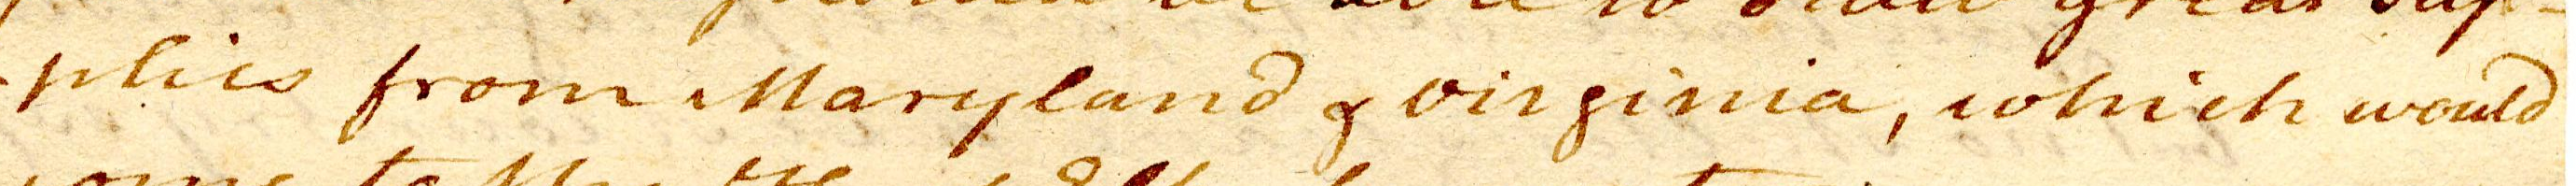plies from Maryland & virginia, which would
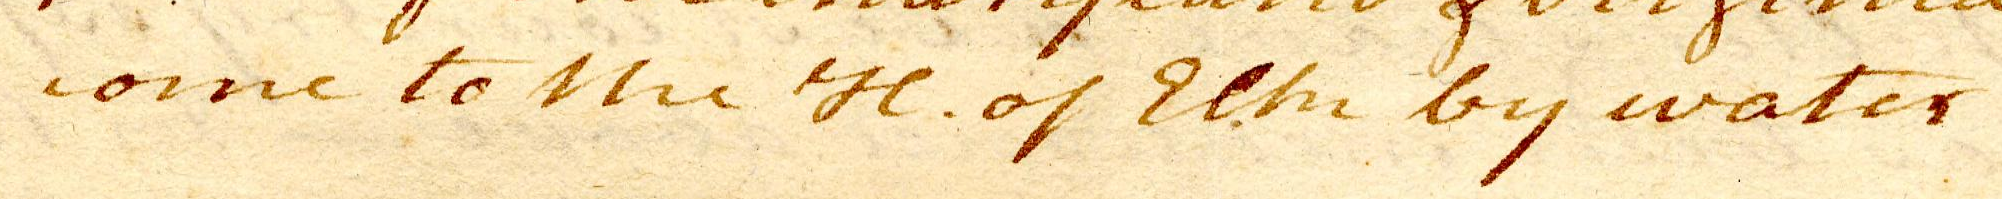come to the H. of Elm by water
